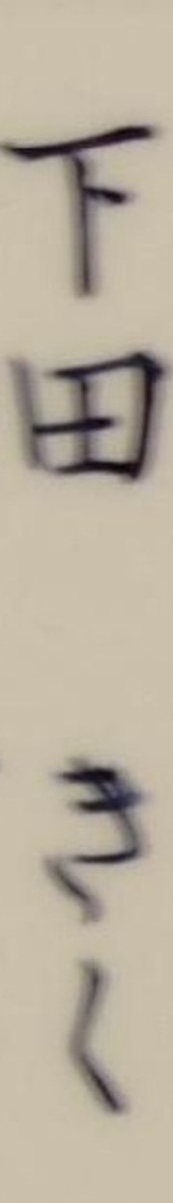下田きく
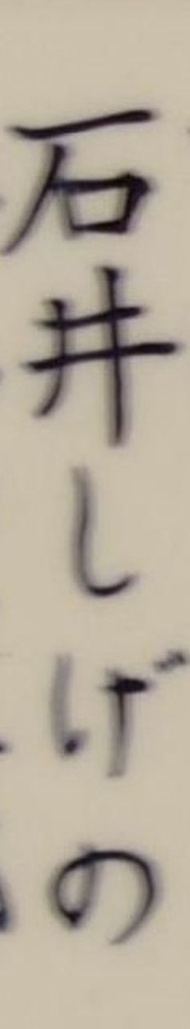石井しげの
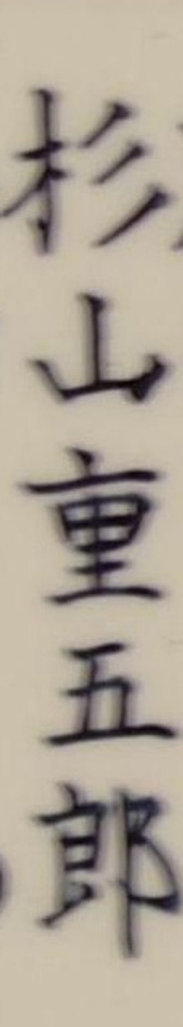杉山重五郎
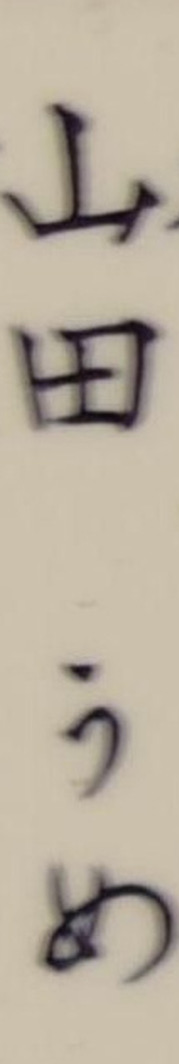山田うめ
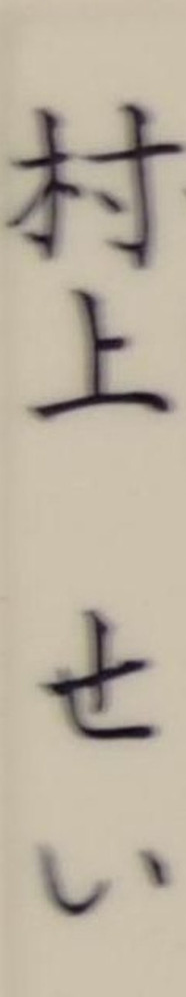村上せい

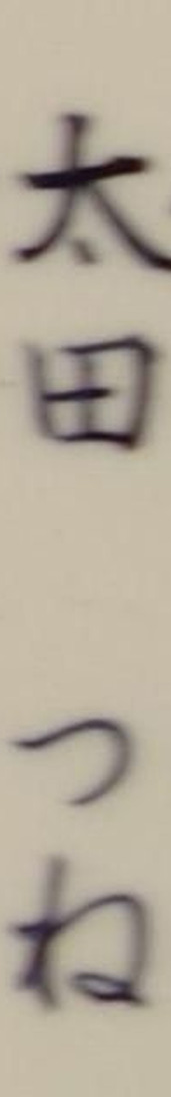太田つね
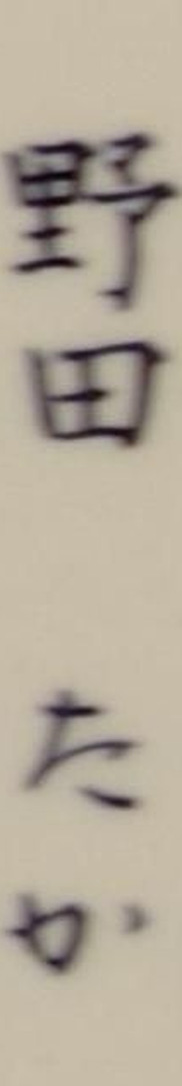野田たか
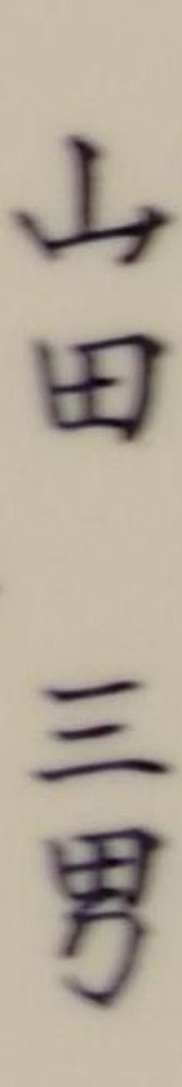山田三男
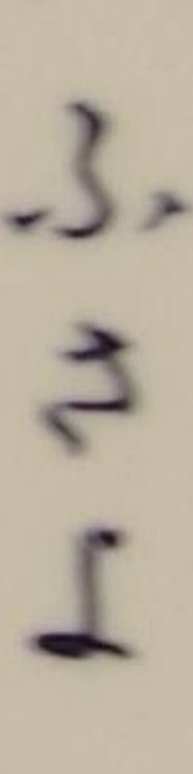ふさよ
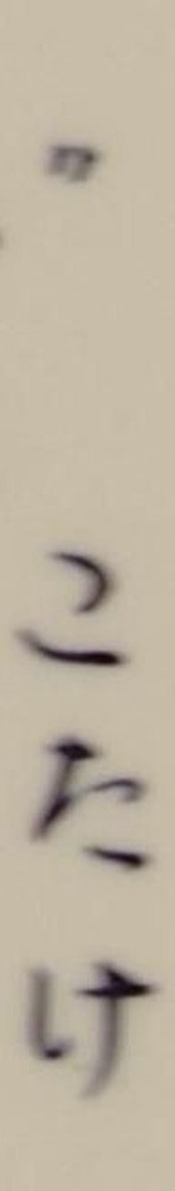こたけ
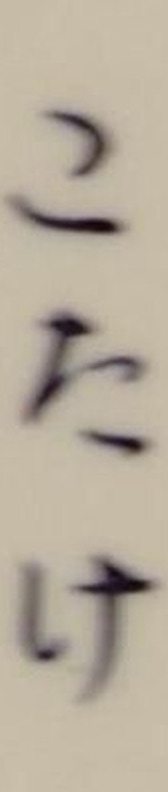こたけ
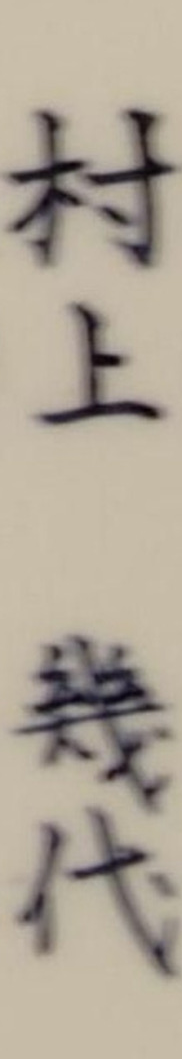村上幾代
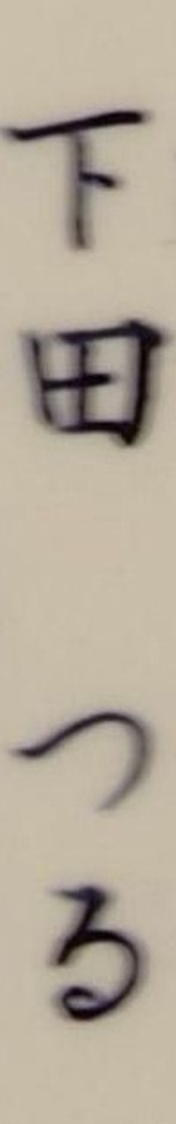下田つる
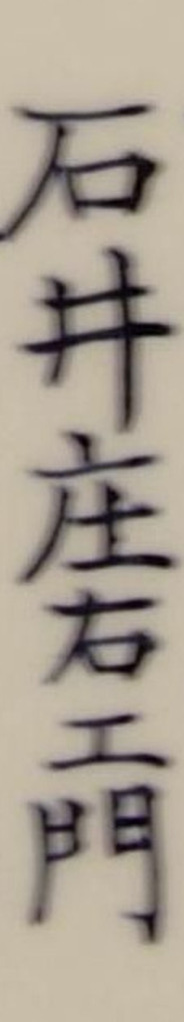石井庄右エ門
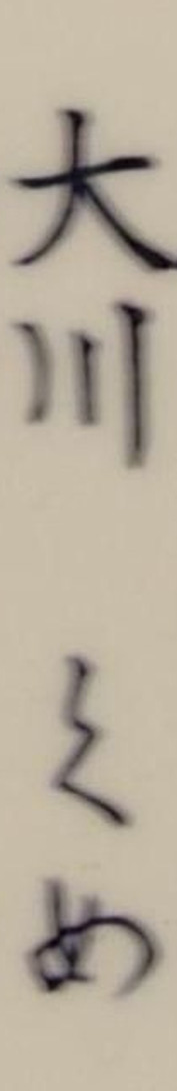大川くめ
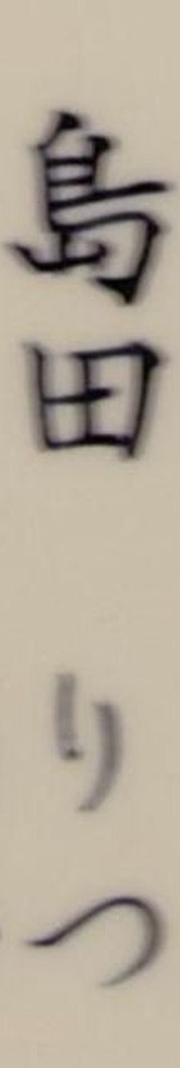島田りつ
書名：E~L
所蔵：高野山金剛峯寺
